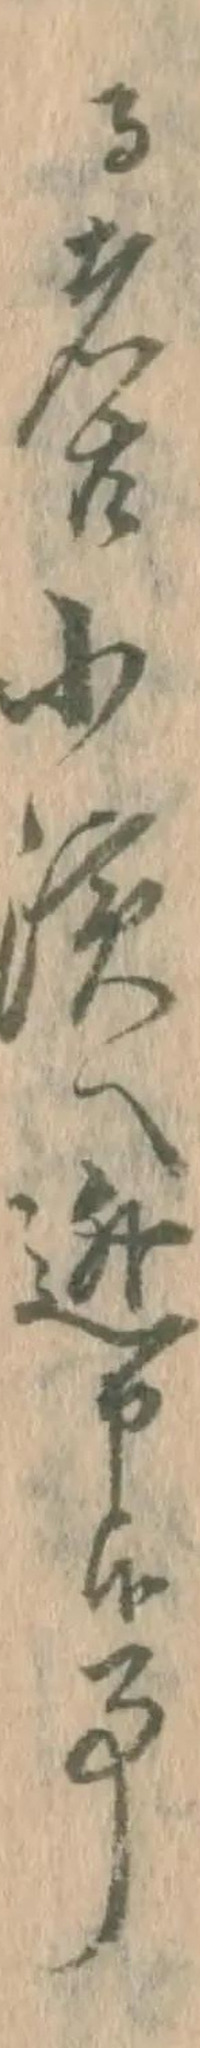る者共小浜へ逃申候事
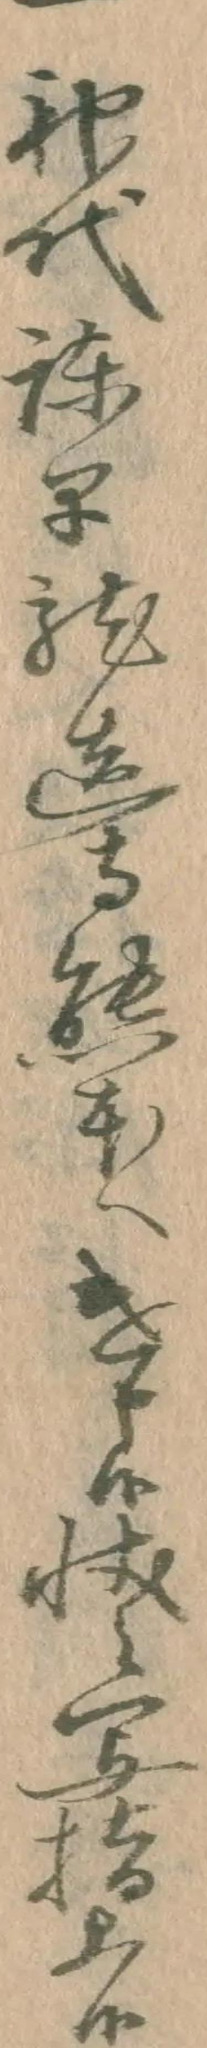一神代諌早龍造守熊本へ遣申候状之写指上候
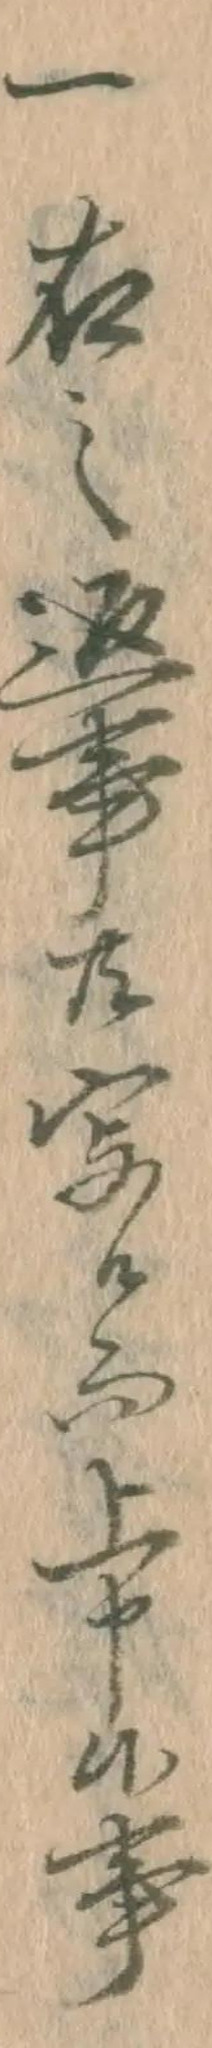一右之返事共写候而上申候事
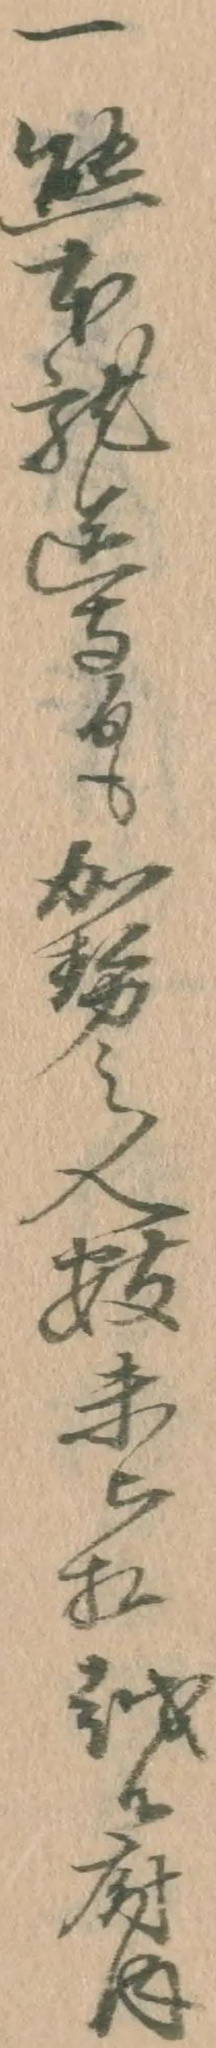一熊本龍造守ゟも加勢之人数未被相越候府内
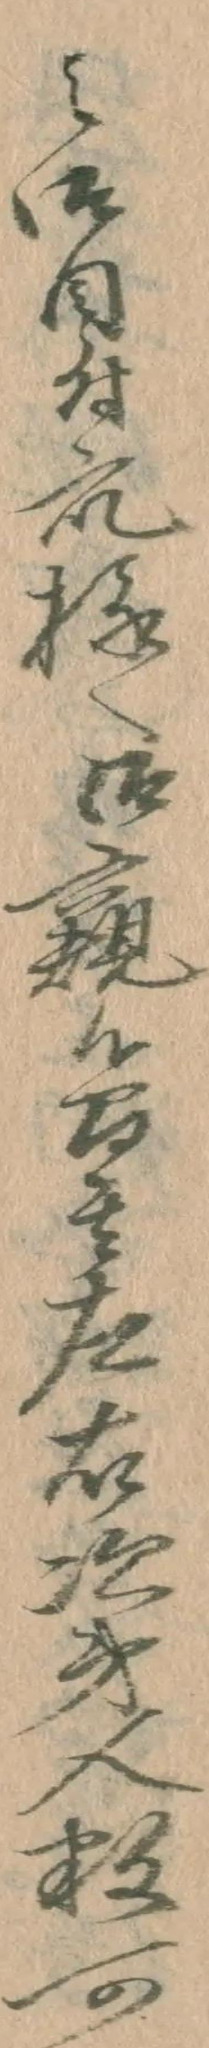之御目付衆様へ御窺候間其左右次第人数可
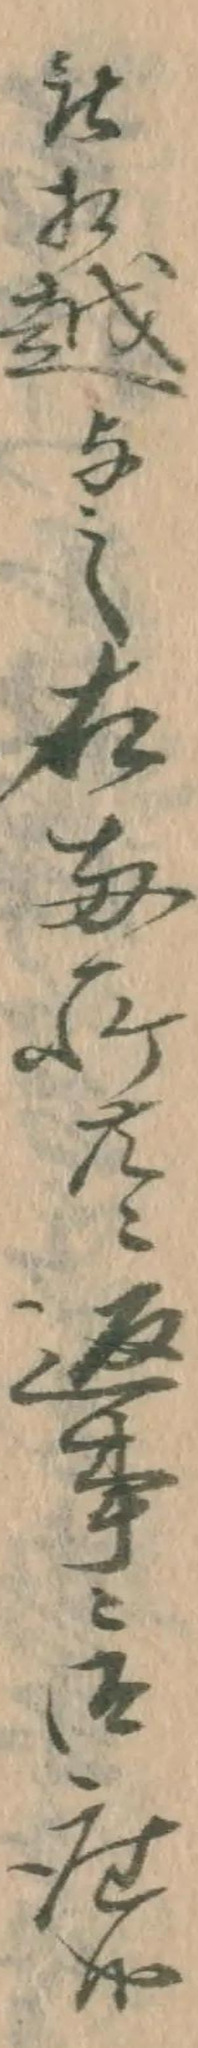被相越与之右両所共に返事に御座候
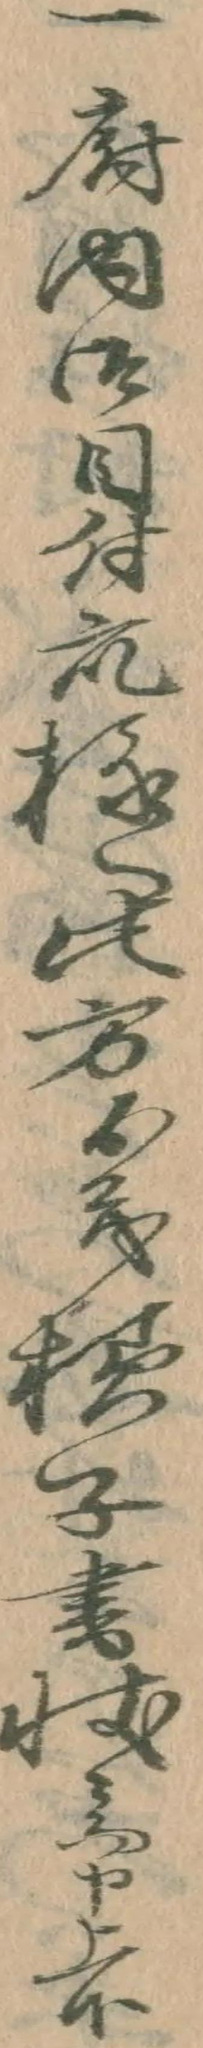一府内御目付衆様へ此方ゟ茂様子書状に而申上候
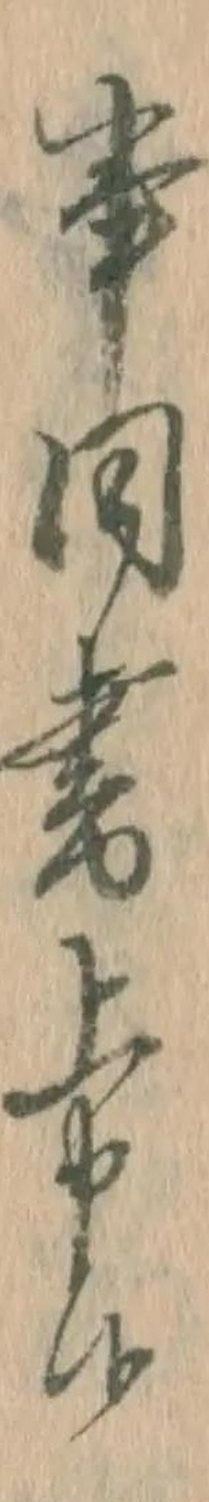事同書上申候
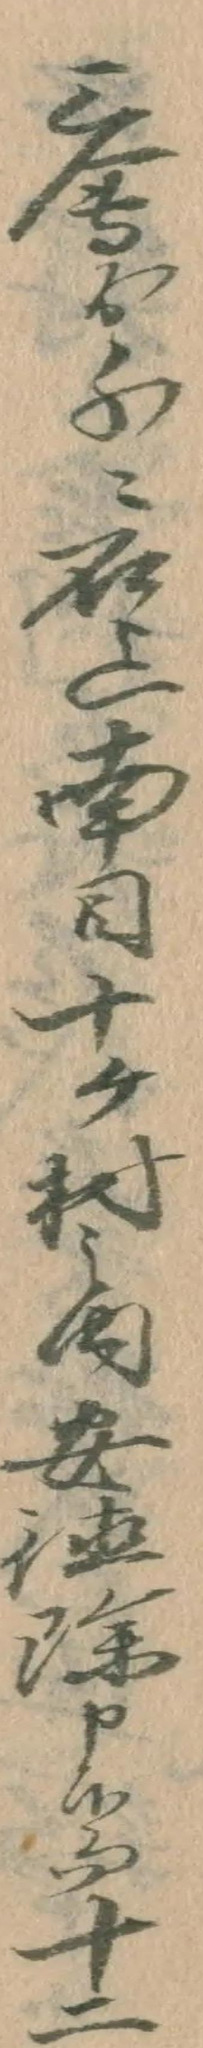一三会ゟ千々石迄南目十け村之内安徳除申候而十二
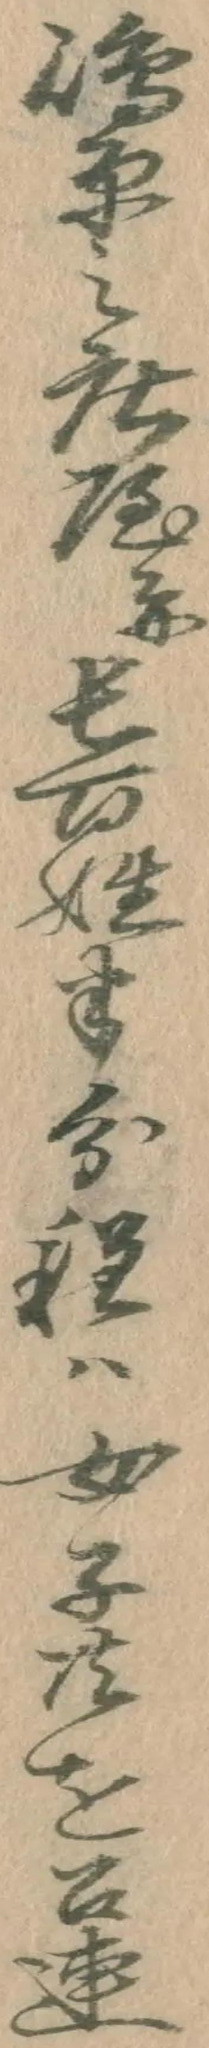島原之庄屋幷長百姓半分程は女子共を召連
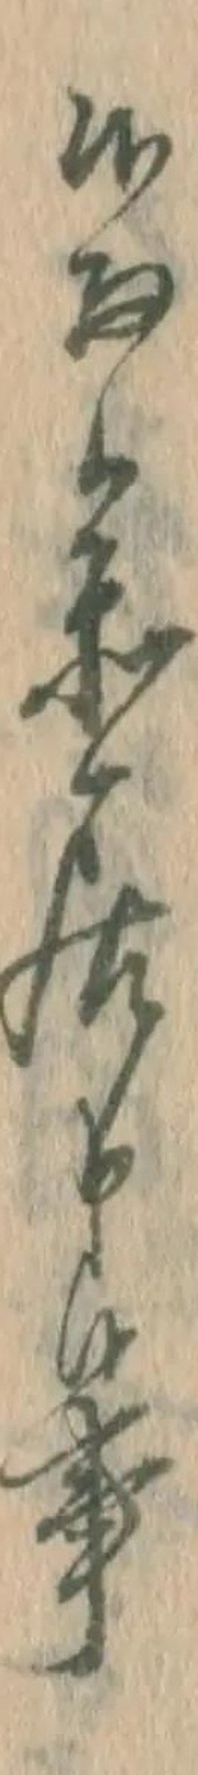候而参居申候事
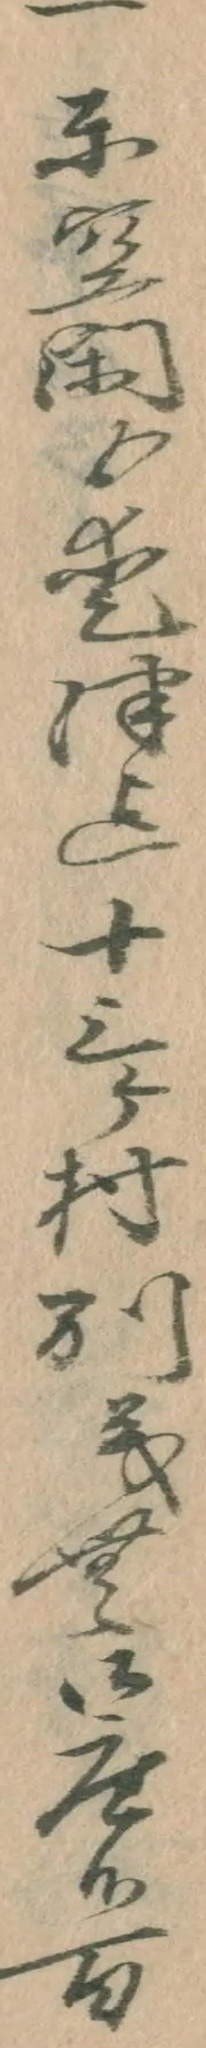一東空閑ゟ登津迄十三け村別茂無御座候百
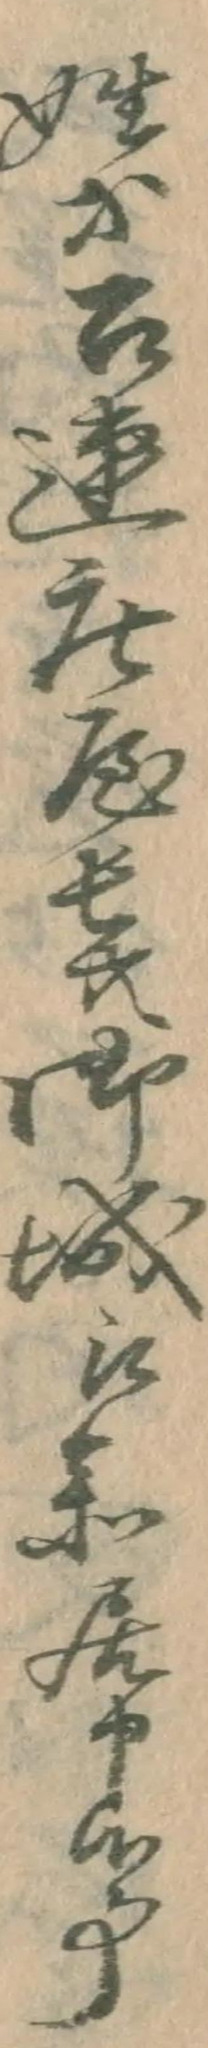姓等召連庄屋長共御城被参居申候事
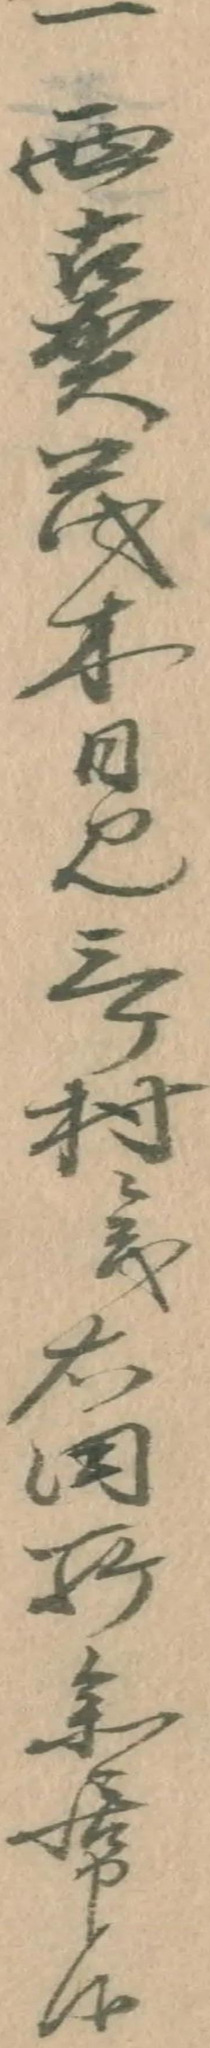一西古賀茂木目見三け村に茂右同所参居申候

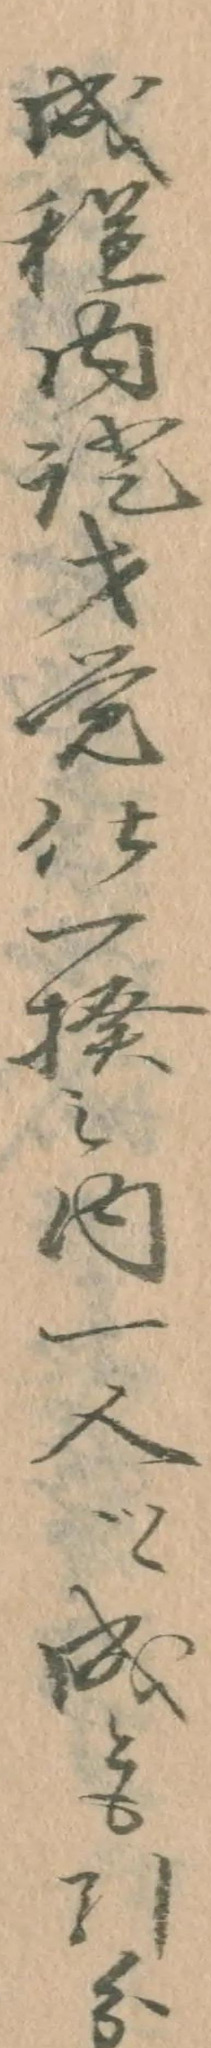一成程内證才覚仕一揆之内一人つゝ成とも引分
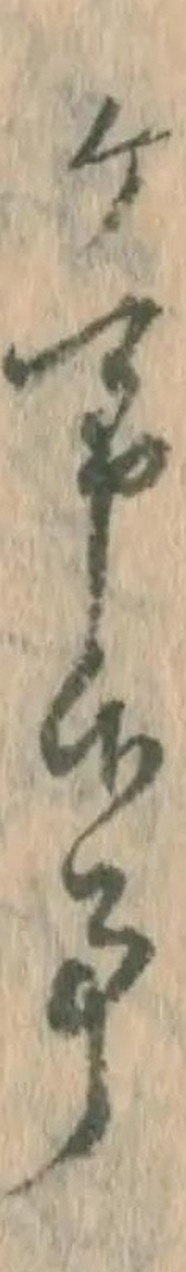け可申候事
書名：切支丹御退治記 49巻. [2]
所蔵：国立国会図書館 National Diet Library, JAPAN
